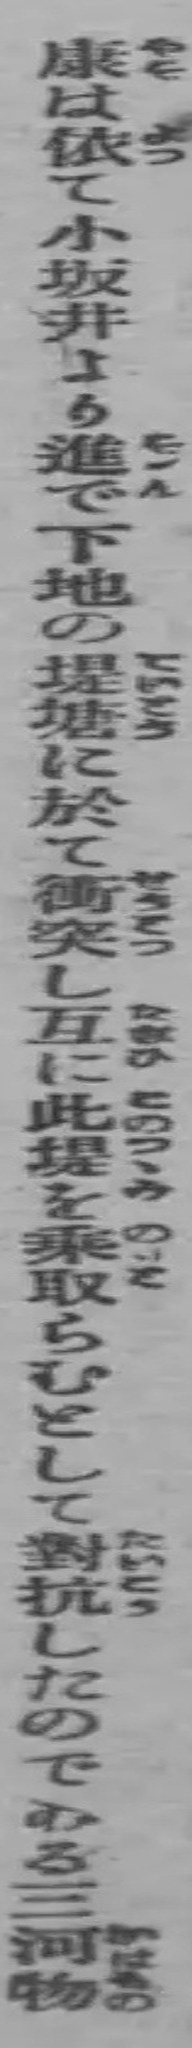康は依て小坂井より進で下地の堤塘に於て衝突し互に此堤を乗取らむとして対抗したのである三河物
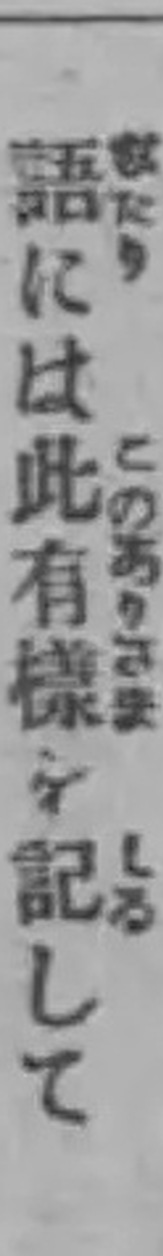語には此有様を記して
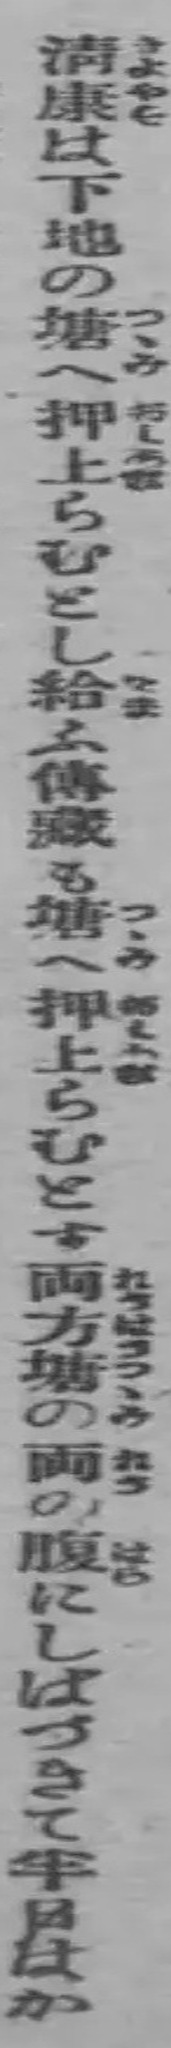清康は下地の塘へ押上らむとし給ふ傳蔵も塘へ押上らむとす両方塘の両の腹にしばづきて半日はか
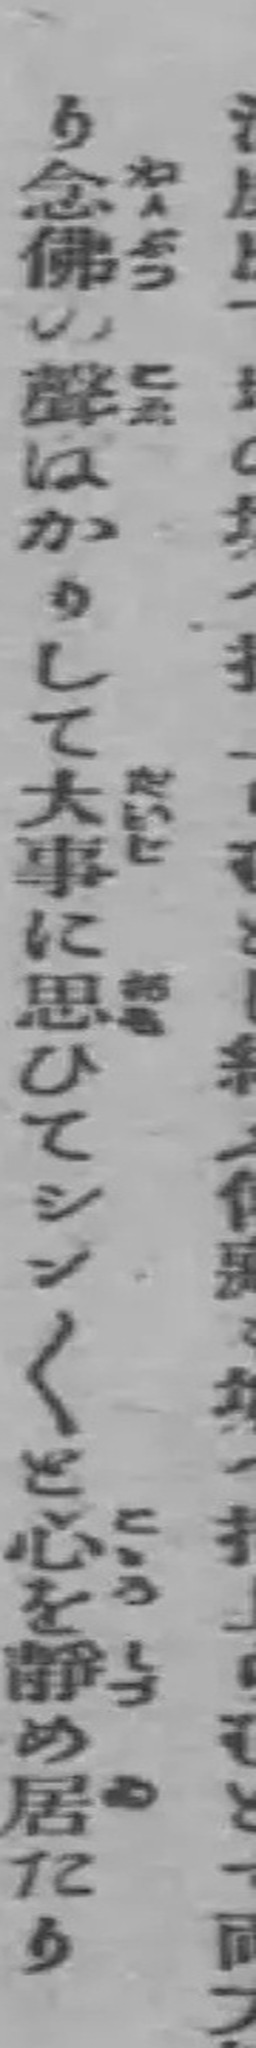り念仏の声はかりして大事に思ひてシン〳〵と心を静め居たり
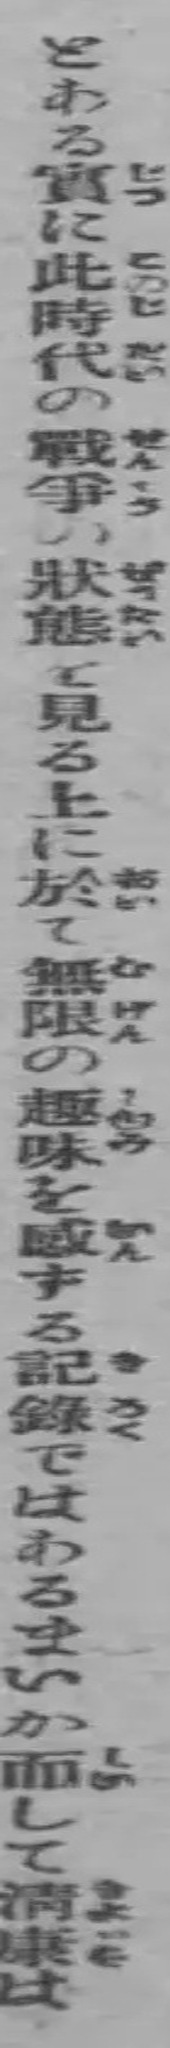とある実に此時代の戦争の状態を見る上に於て無限の趣味を感ずる記録ではあるまいか而して清康は
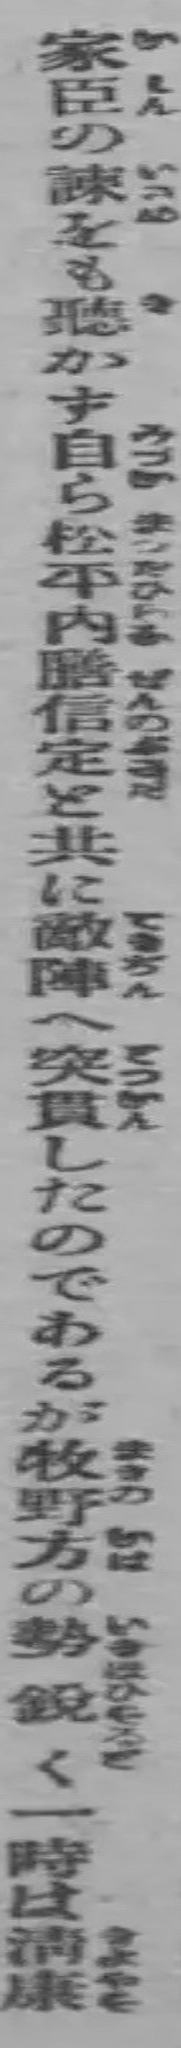家臣の諌をも聴かず自ら松平内膳信定と共に敵陣へ突貫したのであるが牧野方の勢鋭く一時は清康
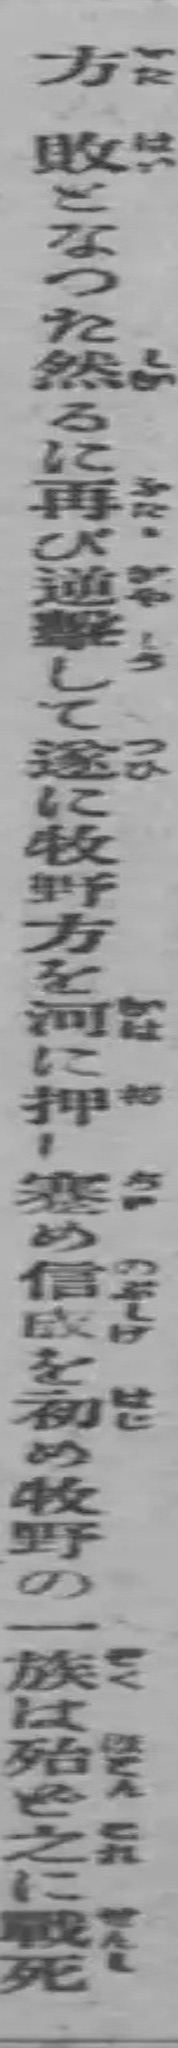方の敗となつた然るに再び逆襲して遂に牧野方を河に押し蹇め信成を初め牧野の一族は殆ど之に戦死
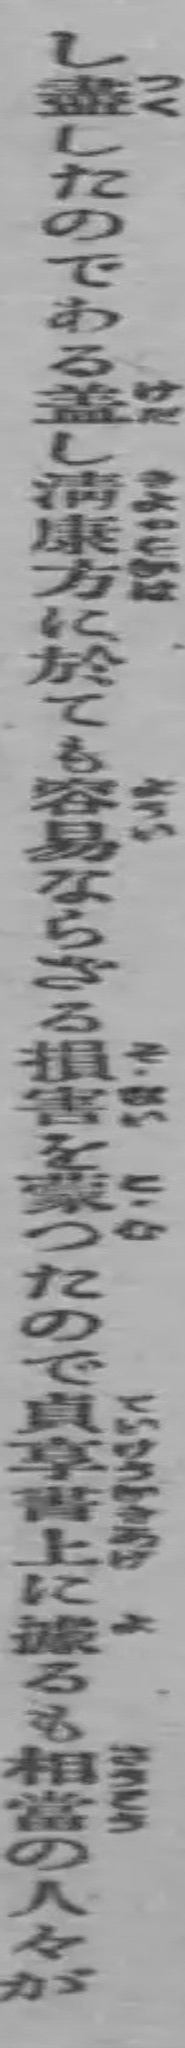し尽したのである蓋し清康方に於ても容易ならざる損害を蒙つたので貞享書上に拠るも
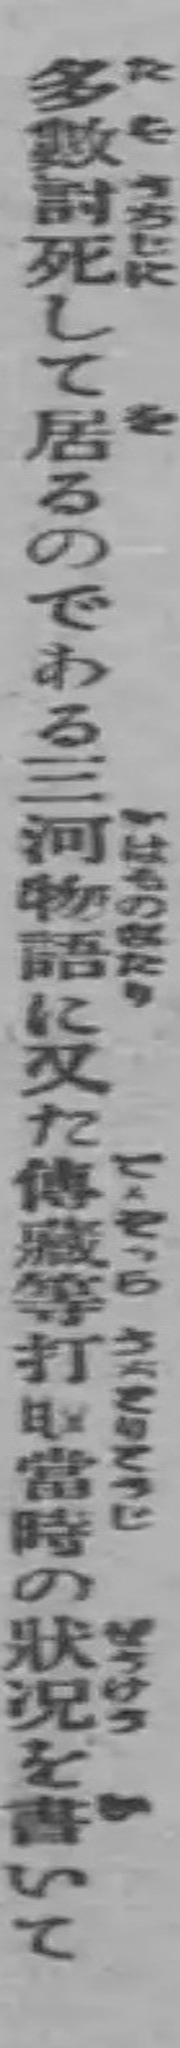多数討死して居るのである三河物語に又た傳蔵等打取当時の状況を書いて
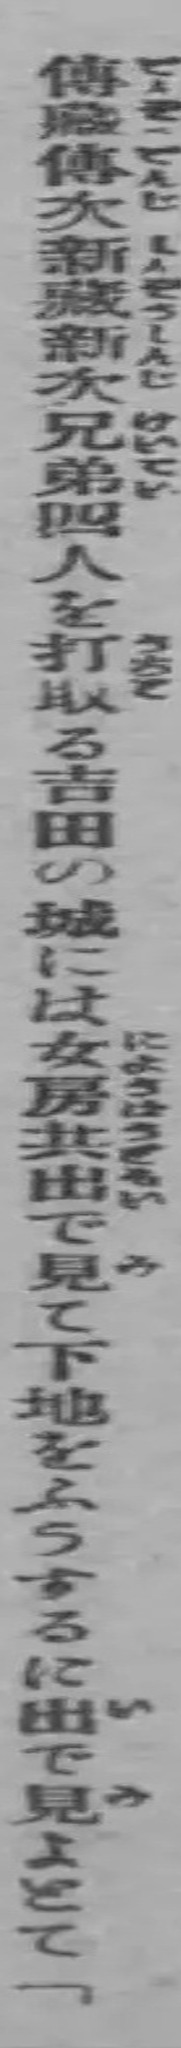傳蔵傳次新蔵新次兄弟四人を打取る吉田の城には女房共出で見て下地をふうするに出で見よとて「
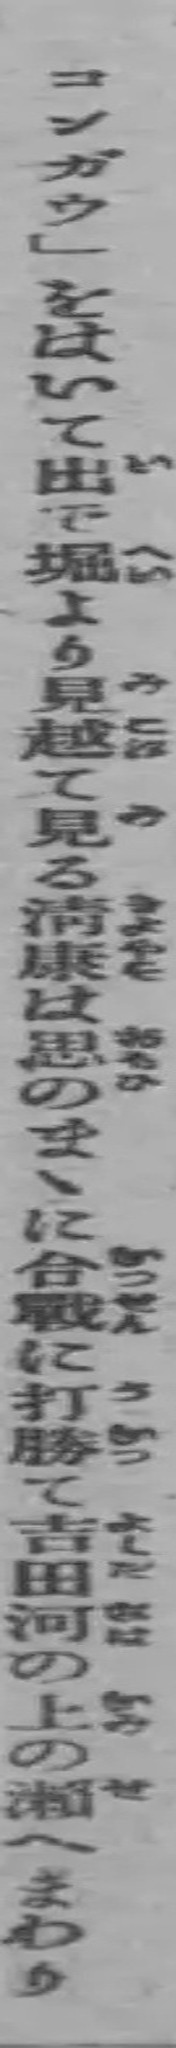コンガウ」をはいて出で堀より見越て見る清康は思のまゝに合戦に打勝て吉田河の上の瀬へまわり
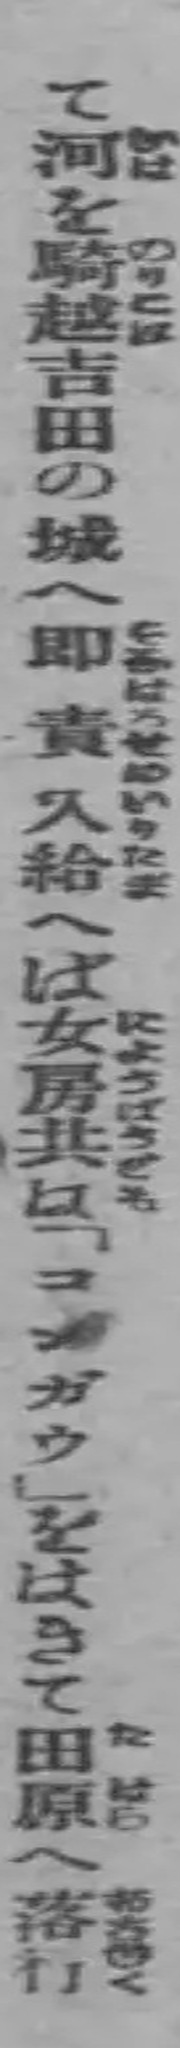て河を騎越吉田の城へ即ち責入給へば女房共は「コンガウ」をはきて田原へ落行
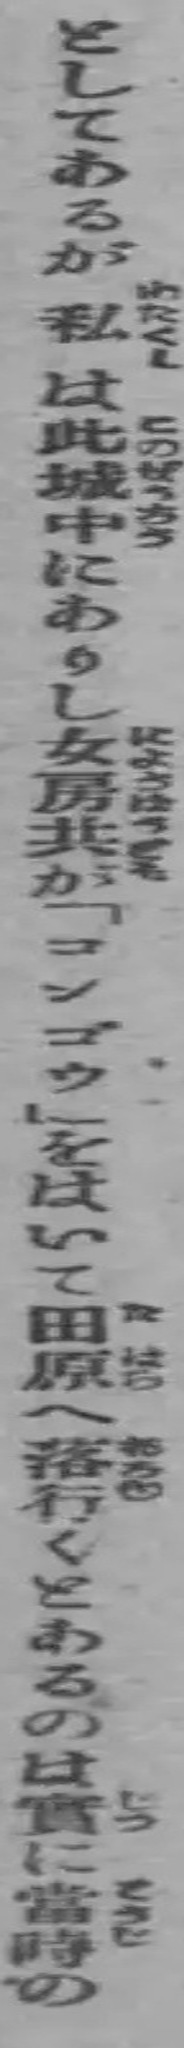としてあるが私は此城中にありし女房共が「コンガウ」をはいて田原へ落行くとあるのは実に当時の

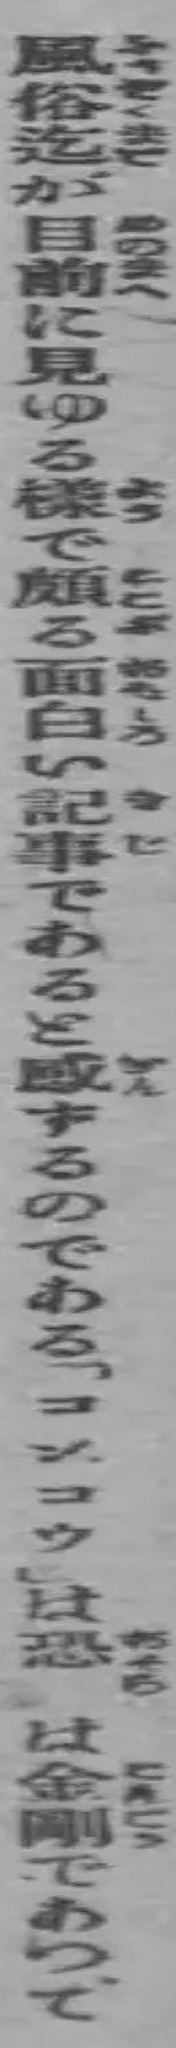風俗迄が目前に見ゆる様で頗る面白い記事であると感ずるのである「コンコウ」は恐は金剛であつて
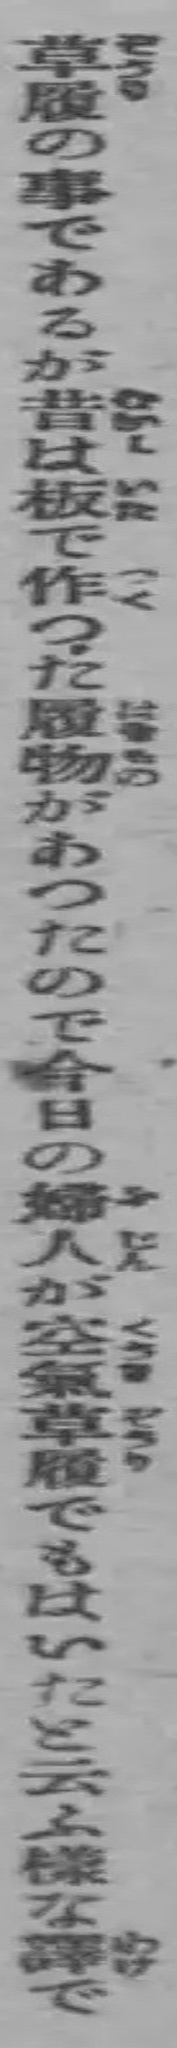草履の事であるが昔は板で作つた履物があつたので今日の婦人が空気草履でもはいたと云ふ様な訳で
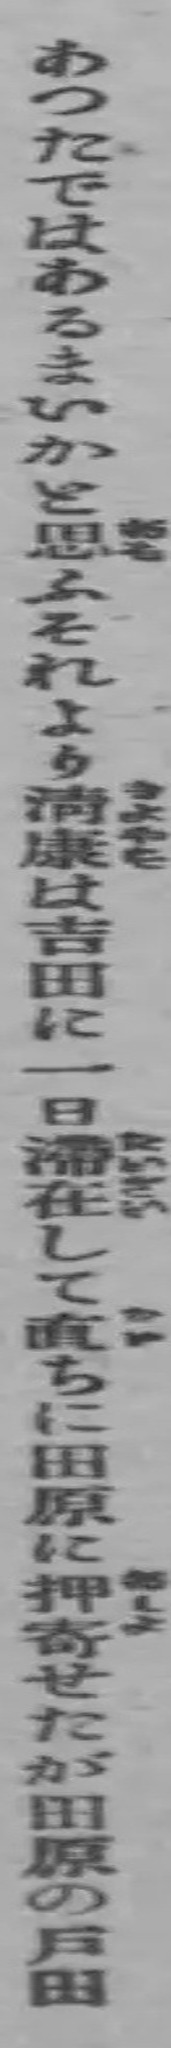あつたのではあるまいかと思ふそれより清康は吉田に一日滞在して直ちに田原に押寄せたが田原の戸田
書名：豊橋市史談
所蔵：国立国会図書館 National Diet Library, JAPAN
